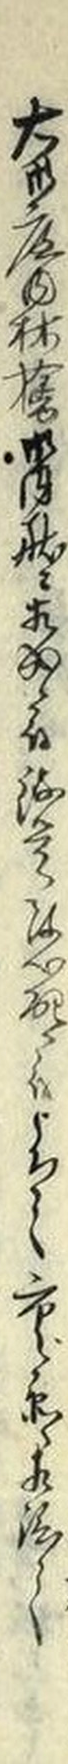右御庭内林檎御内献ニ相成候ニ付彼是致心配候ニ付被下之市郎兵衛へ相渡之
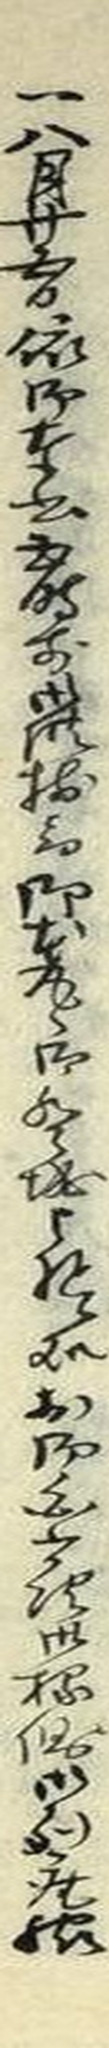一八月廿五日依御奉書五時前御供揃ニ而御本丸へ御登城被遊候処於御白書院御縁側御列座脇
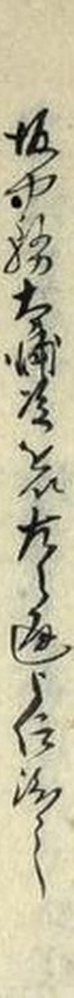坂中務大輔殿を以左之通被仰渡之
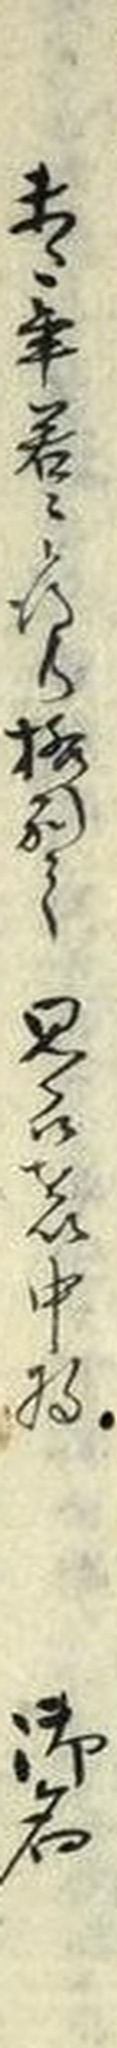未た年若ニ候得共格別之思召を以中将御名
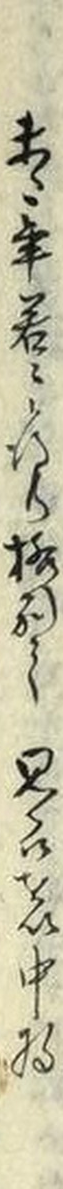未た年若ニ候得共格別之思召を以中将御名
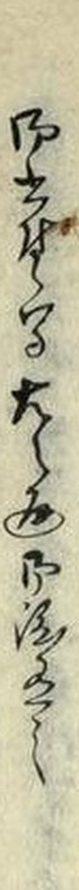御書付之写左之通御渡有之
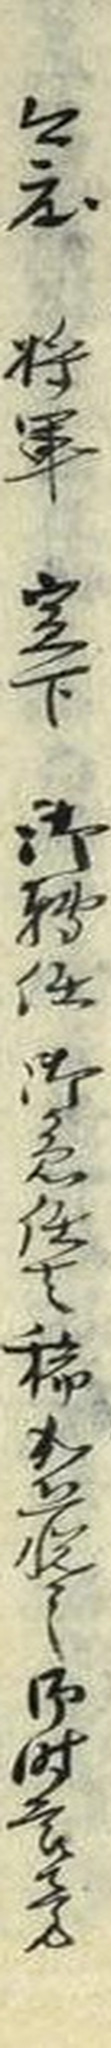今度将軍宣下御転任御兼任者稀成恐悦之御時節旁
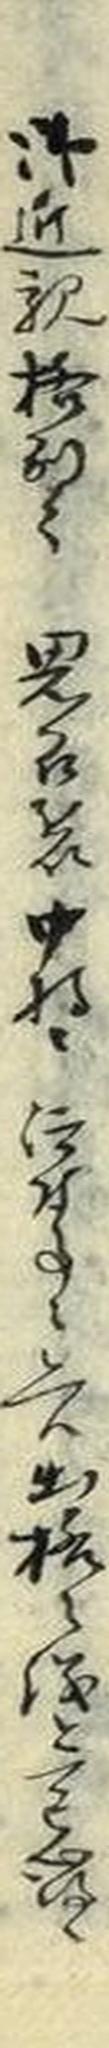御近親格別之思召を以中将被仰付事ニ候ヘハ出格之儀と可被心得候
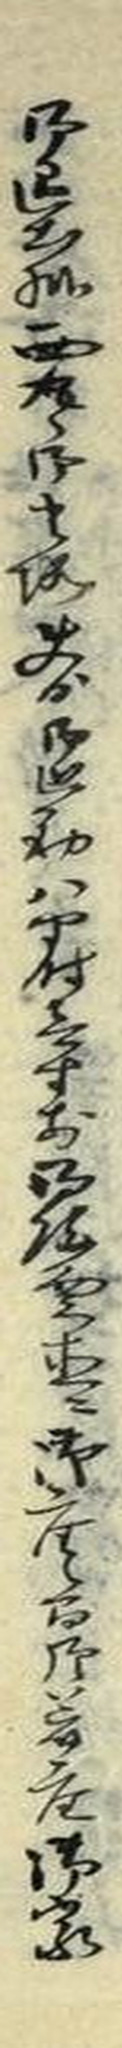御退出掛西丸へ御登城夫ゟ御廻勤八半時壱寸前御帰殿直ニ御座之間御着座御家

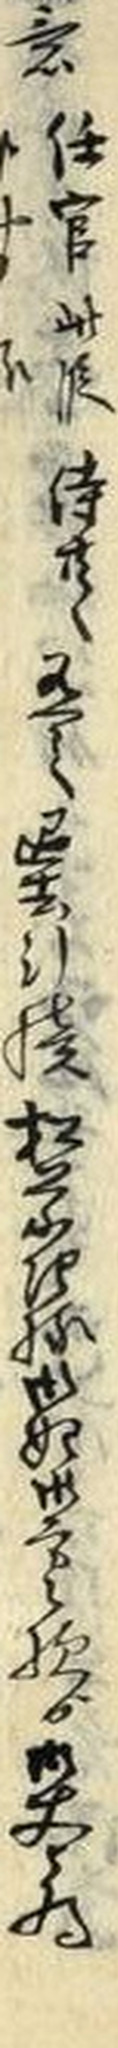申聞候様有之退去引続松栄院様御始御方々様ゟ御使被為
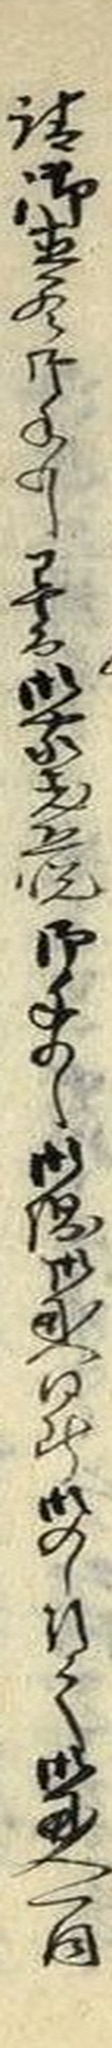請御直答御手のし畢而御家老恐悦御手のし御側向御用人同断御のし引之御用人一同
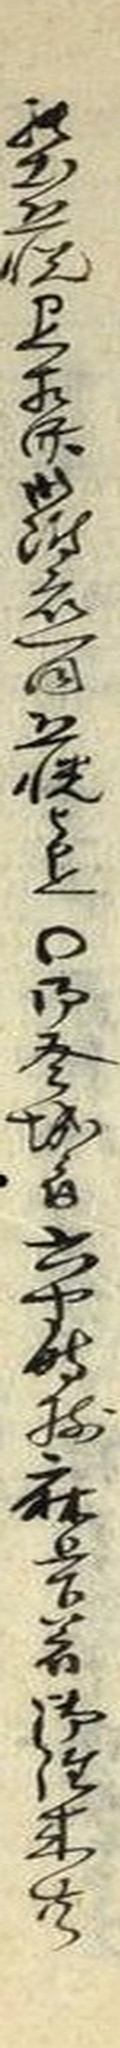罷出恐悦申上相済御附衆一同恐悦被申上〇御登城ニ付六半時揃麻上下着御往来共
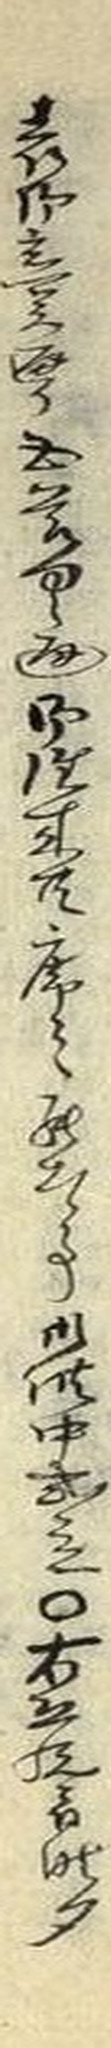表御玄関通り五節句之通御往来共席々へ罷出候事御供中式立〇右恐悦ニ付昨夕
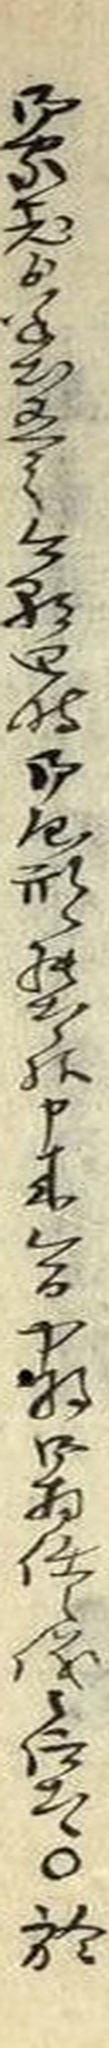御家老ゟ呼出有之今朝四時御屋形へ罷出候様申来今日中将御拝任之儀被仰出候〇於
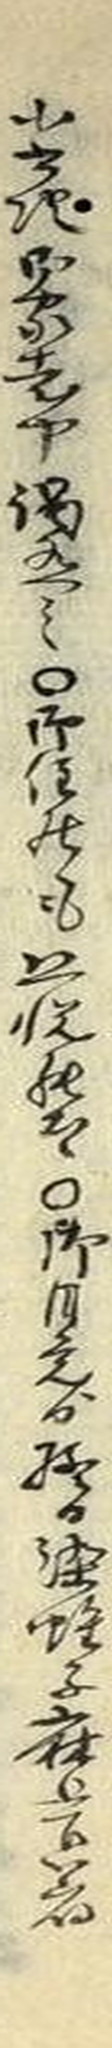小書院御家老中謁有之〇御住居へも恐悦罷出候〇御目覚ゟ終日染帷子麻上下着
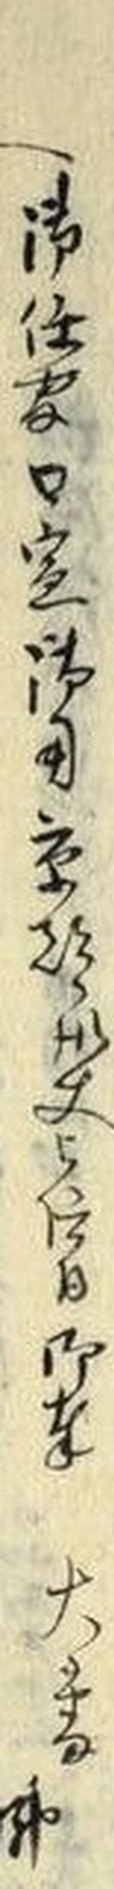御任官口宣御用京都へ御使被仰付御奉大番
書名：少傅日録抄（斉善付側向頭取日記、在府）
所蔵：福井県文書館 Fukui Prefectural Archives
